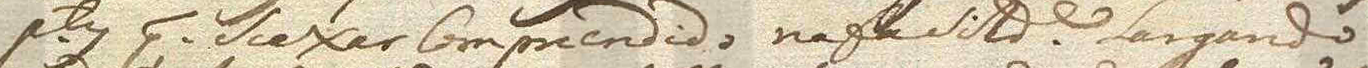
p.tes p̄ se axar Compreendido na fasild.e Largando
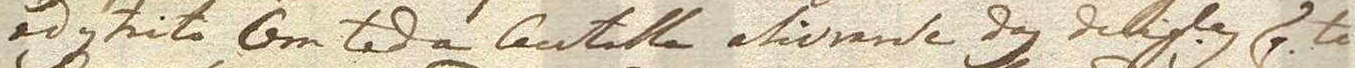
o destrito Com toda Cautella a livrarse das delig.cas q̄ te
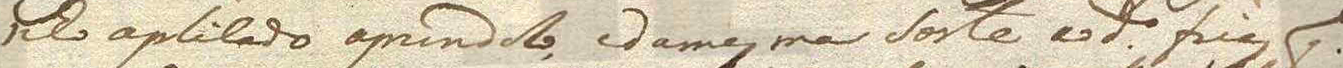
nho apliCado a prendelo, e da mesma sorte ao d.o frias q̄
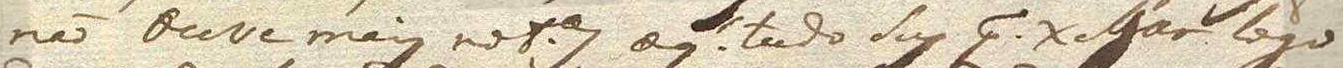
naõ ouve mais not.as o q̄ tudo sey p̄ xegar logo
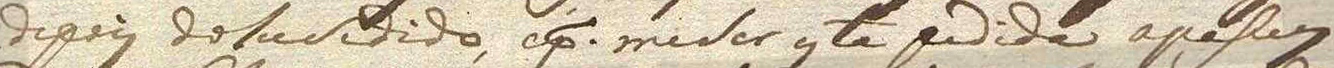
depois do susedido, e p̄. me ser esta pedida a passey
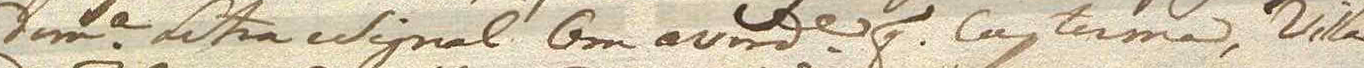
de m.a Letra e Signal Com a verd.e q̄. Custuma, Villa
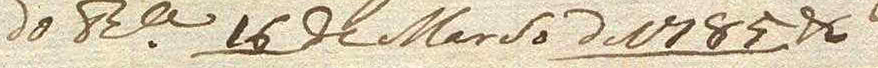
do R.ce 16 de Marso de 1785 &
